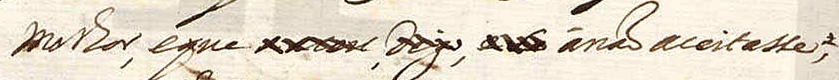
melhor e que_, digo, _a não aceitasse, e
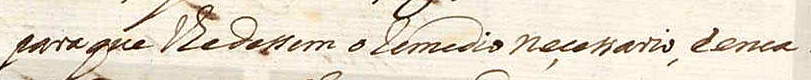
para que lhe dessem o Remedio necessario, e enca
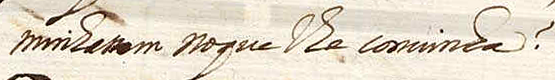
minhassem no que lhe conuinha.
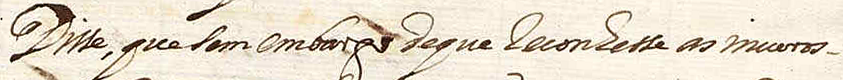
Disse, que Sem embargo de que Reconhesse, as inueras
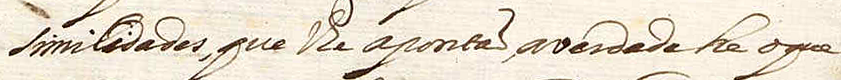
similidades, que lhe apontaõ, a verdade he o que
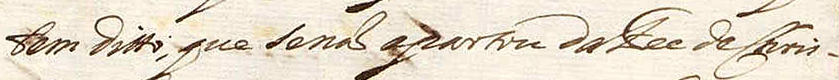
tem ditto; que se não apartou da Fee de Chris
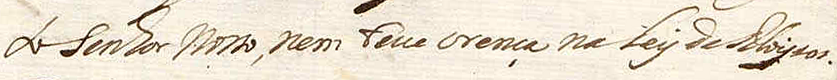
to senhor nosso, nem teue crença na Ley de Moyses.
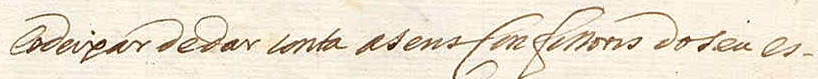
E o deixar de dar conta a seus Confessores do seu es
